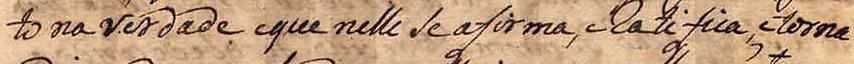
to na verdade e que nelle se afirma, e Ratifica, e torna
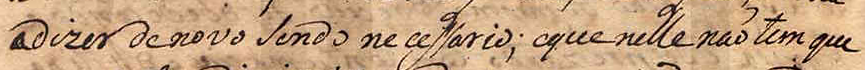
a dizer de novo sendo necessario; e que nelle naõ tem que
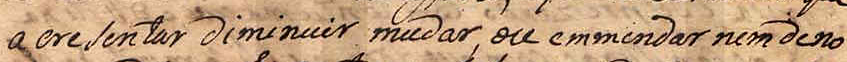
acresentar diminuir mudar, ou emmendar nem de no
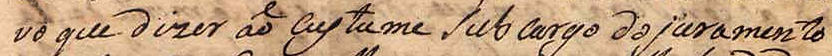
vo que dizer áo custume sub cargo do juramento
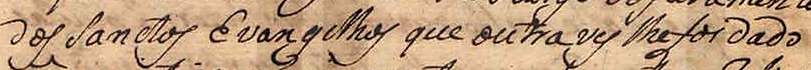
dos sanctos Evangelhos que outra ves lhe foi dado
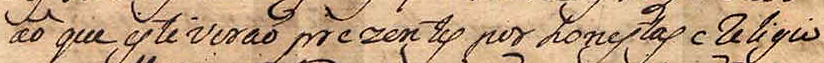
ao que estiveraõ prezentes por honestas e Religio
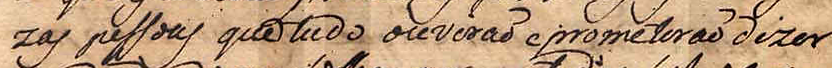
zas pessoas que tudo ouviraõ e prometeraõ dizer
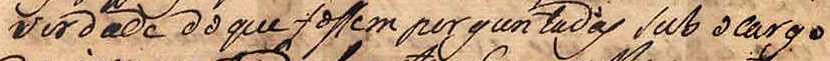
verdade do que fossem perguntadas sub o cargo
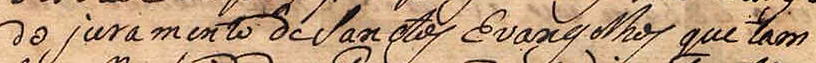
do juramento de Sanctos Evangelhos que tam
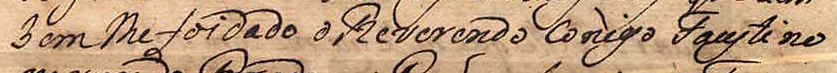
bem lhe foi dado o Reverendo conego Faustino
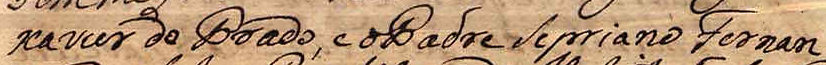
xavier do Prado, e o Padre sepriano Fernan
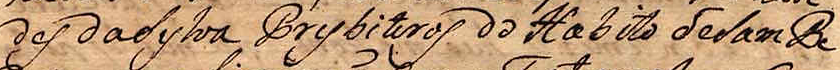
des da Sylva Presbiteros do Habito de Sam Pe
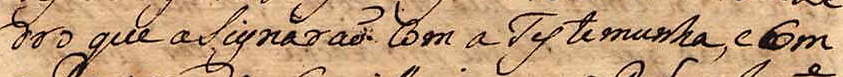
dro que aSignaraõ com a Testemunha, e com
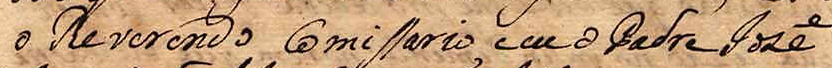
o Reverendo Comissario, e eu o Padre Iozê
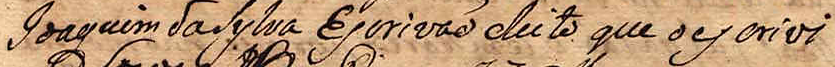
Ioaquim da Sylva Escrivaõ eleito que o escrivi
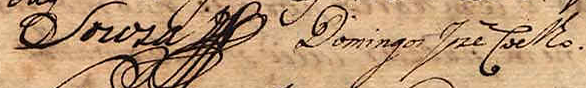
Souza Domingos Joze Coelho.
